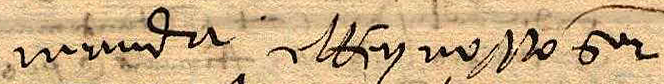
manda el Rey nosso s̄or
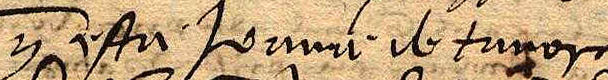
q̄ esta Joana de tauora
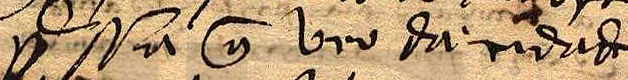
p̄ssa q̄ veo da cidade
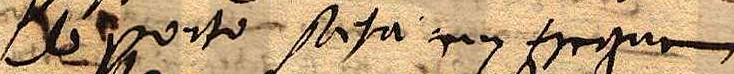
do porto seja emtregue
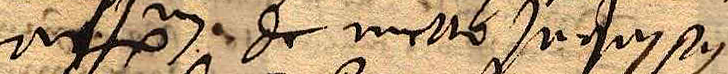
a Jom de mello Jnqujsy
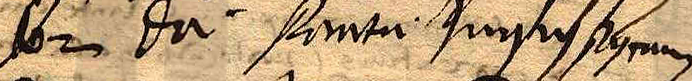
dor da santa Jmqujsyçam
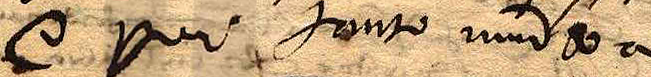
e por tanto mādo a
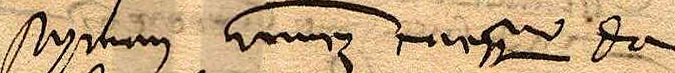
symam nunez cacerrro da
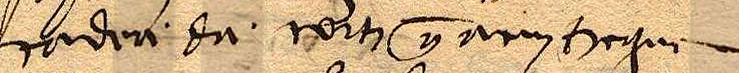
cadea da corte q̄ a emtregue
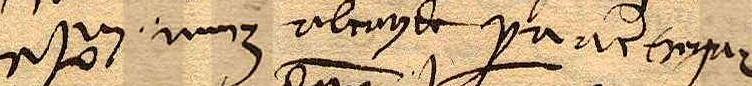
a Jom nunez alcayde ꝑa a ētregar
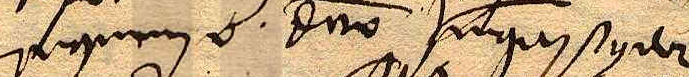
a quem o dito Jmqujsydor
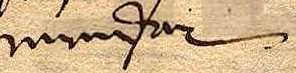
mandar
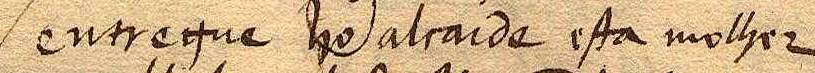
entregue ho alcaide esta molher
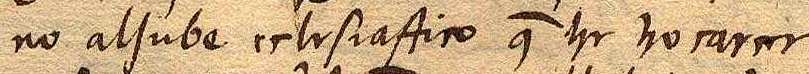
no alJube eclesiastico q̄ he ho carcer
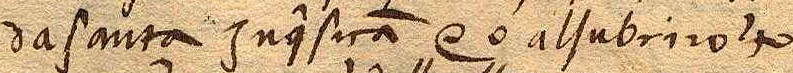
da santa Jnqisiçā e o alJubeiro to
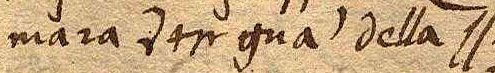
mara ētregua della //
